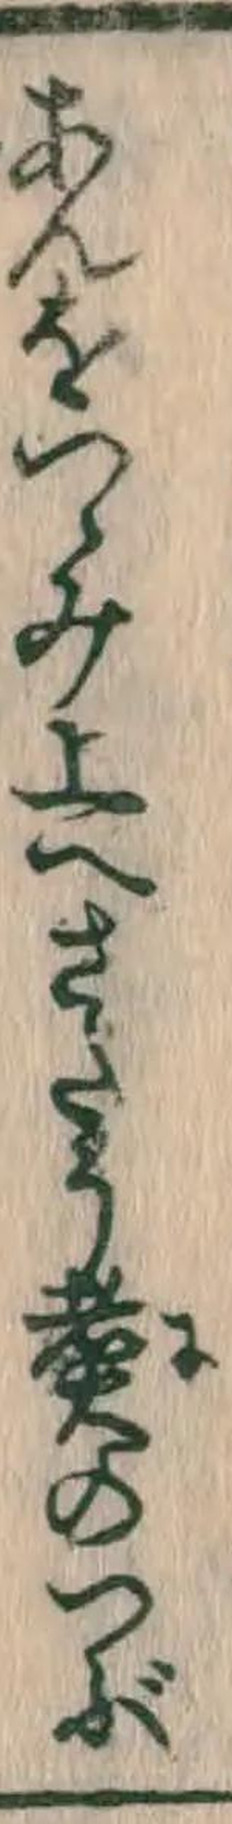あんをつゝみ上へさたう煮のつぶ
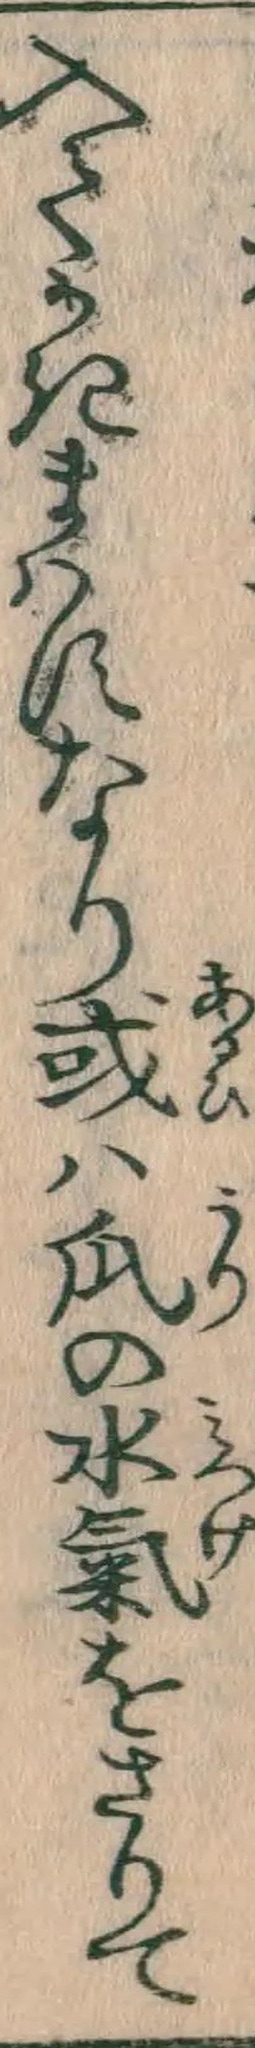入てかきまはすなり或は瓜の水気をさりて
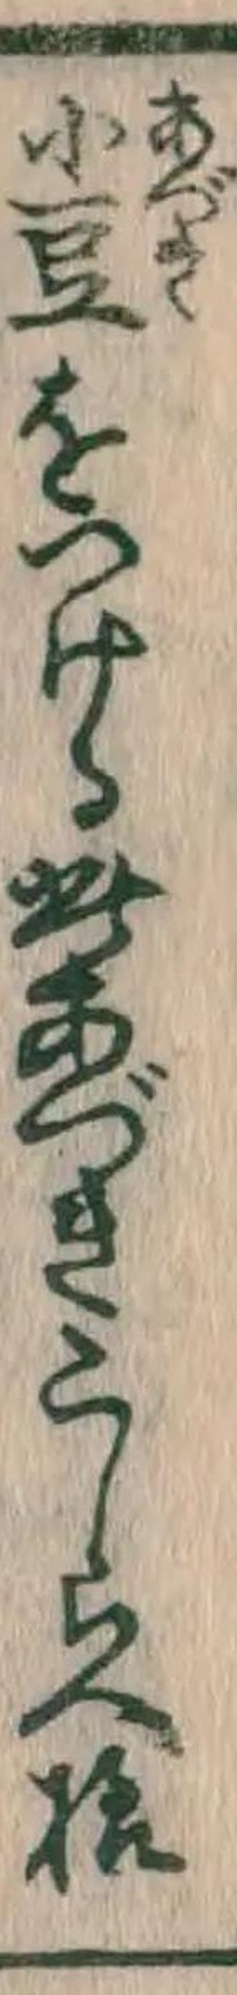小豆をつける此あづきこしらへ様
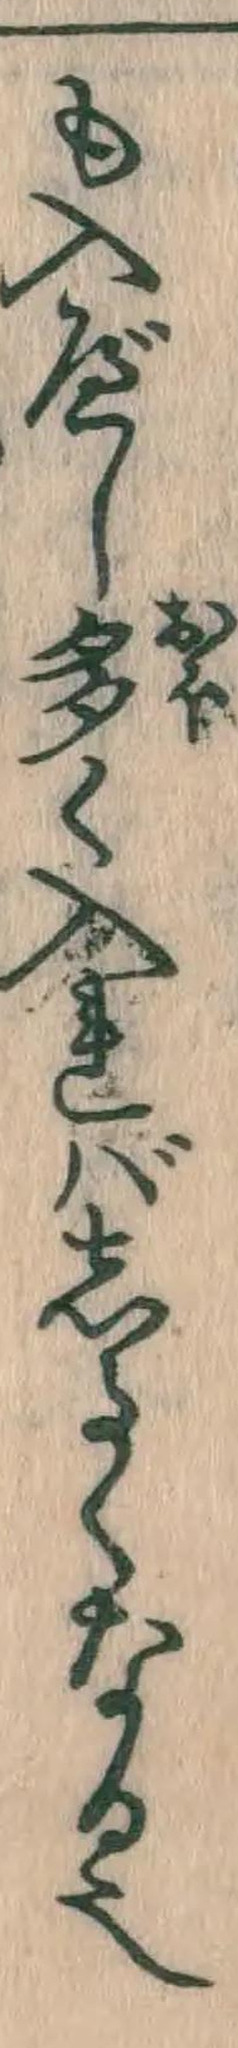も入べし多く入ればしるくなる也
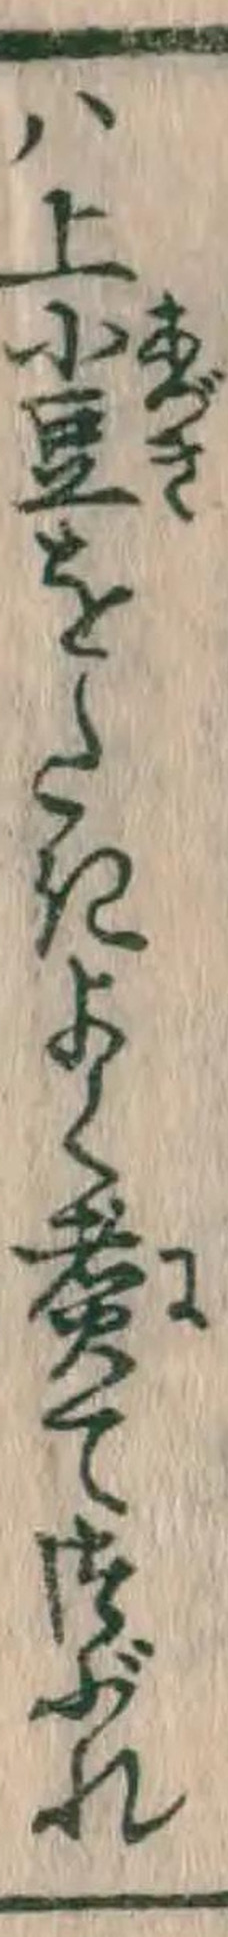は上小豆をたきよく煮てつぶれ
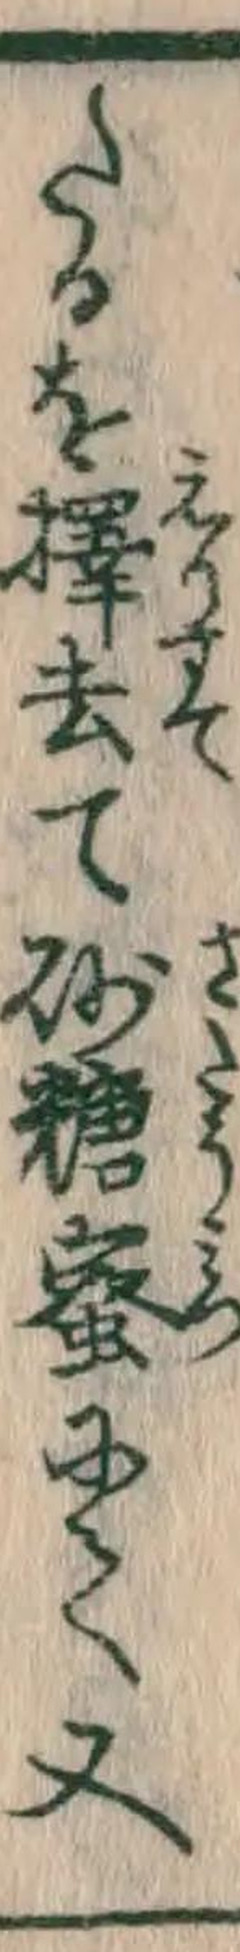たるを択去て砂糖蜜にて又
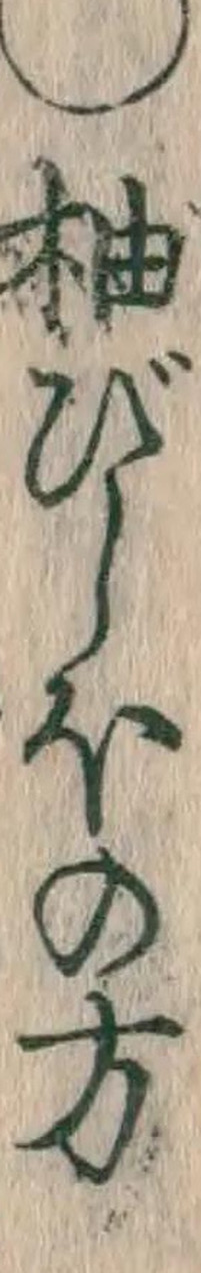○柚びしほの方
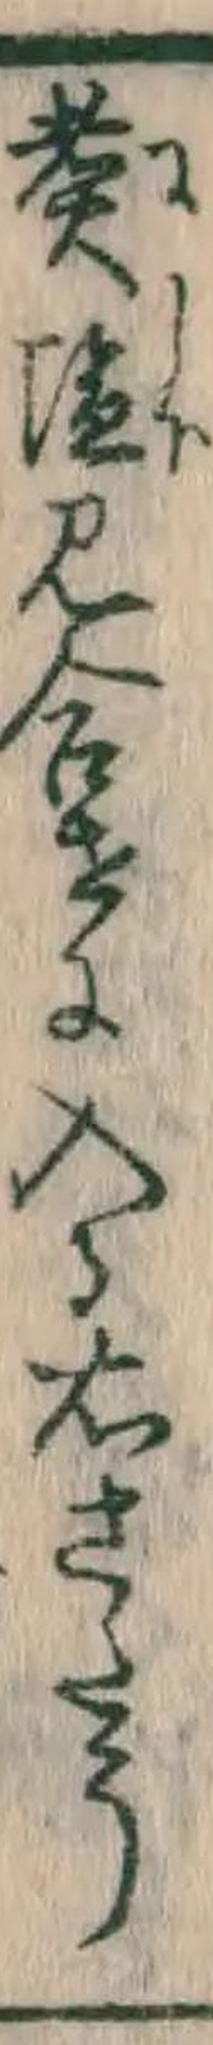煮塩見合せに入る右さたう
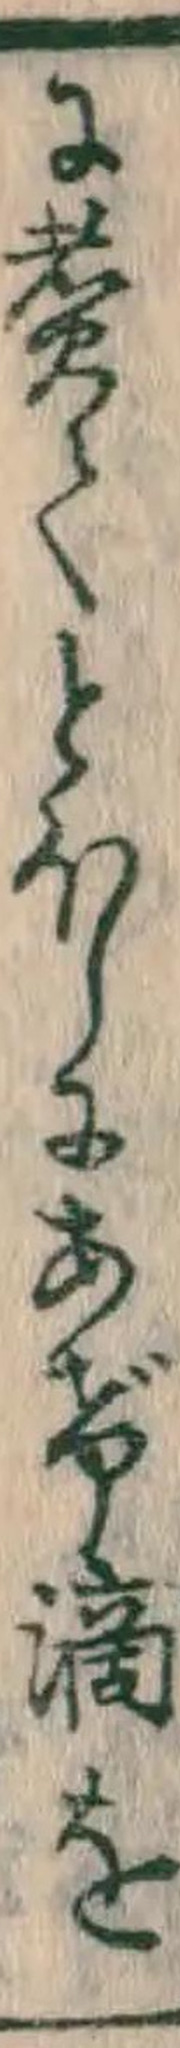に煮てとほしにあげ滴を
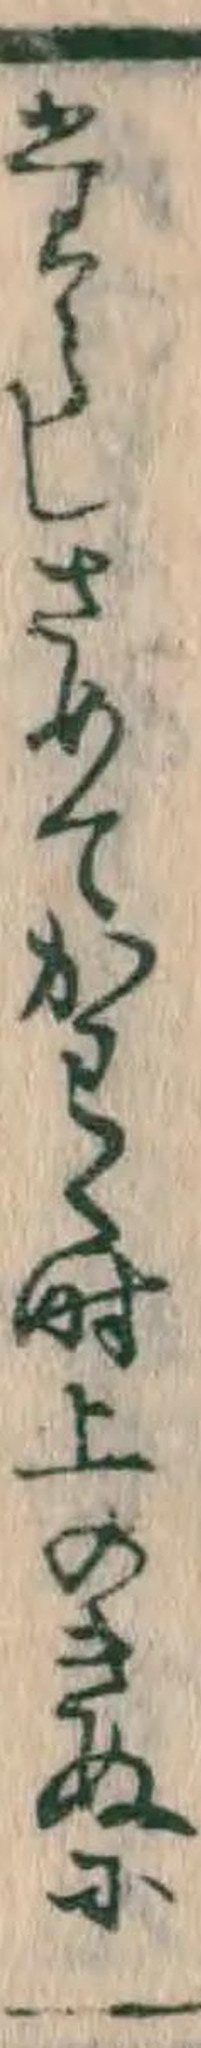たらしさめてかわく時上のきぬに
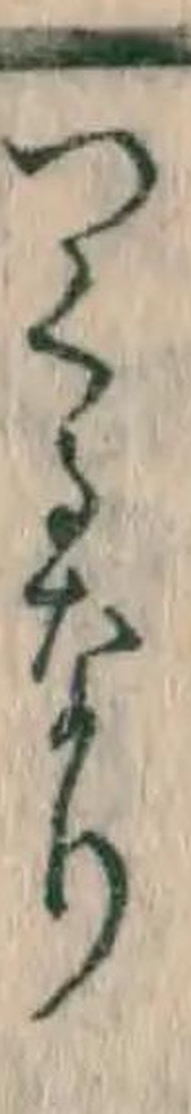つくるなり
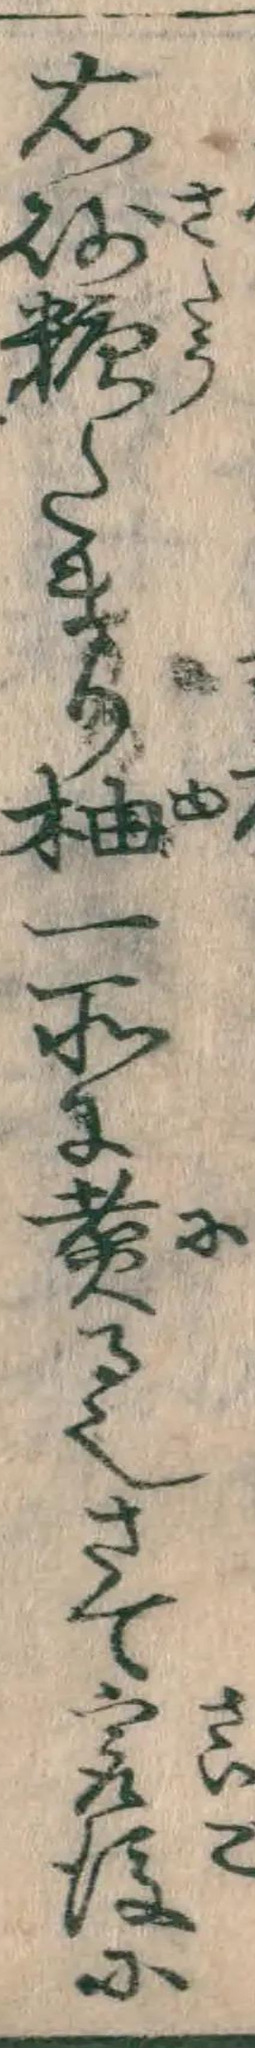右砂糖たまり柚一所に煮る也さて最後に
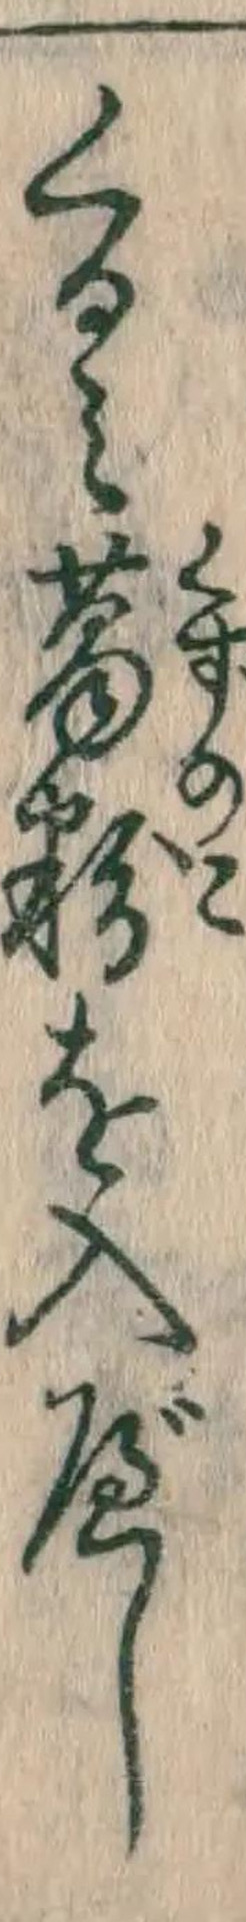くるみ葛粉を入べし
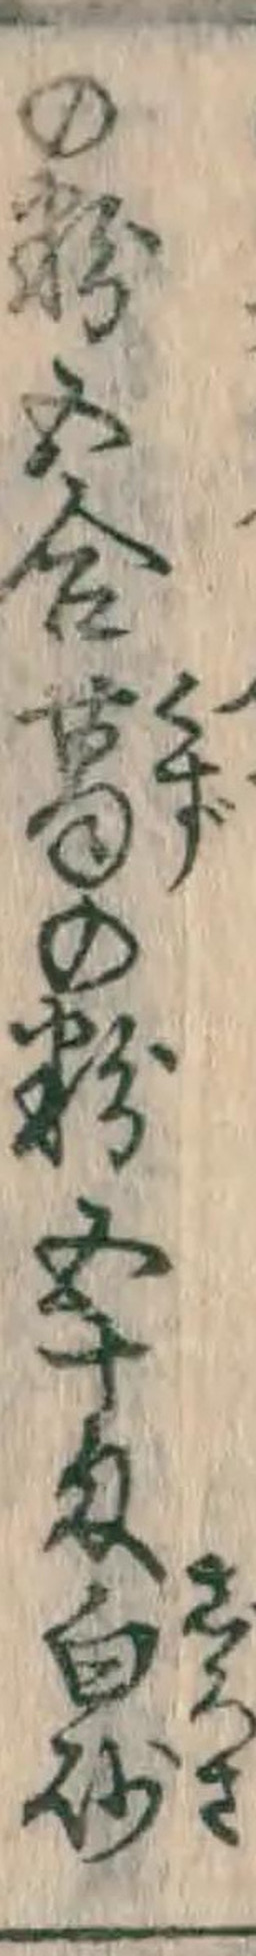の粉五合葛の粉五十匁白砂
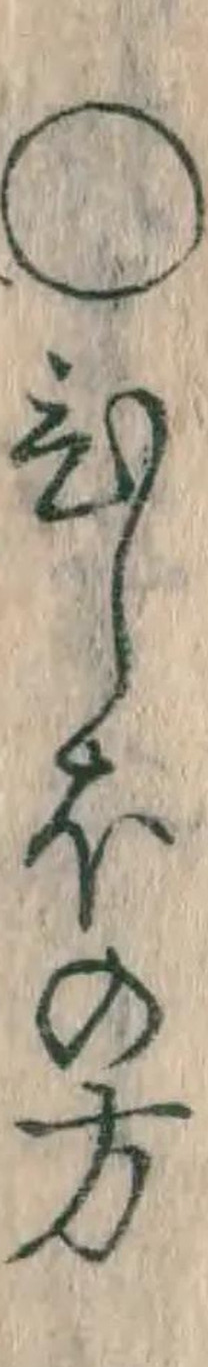○ひしほの方
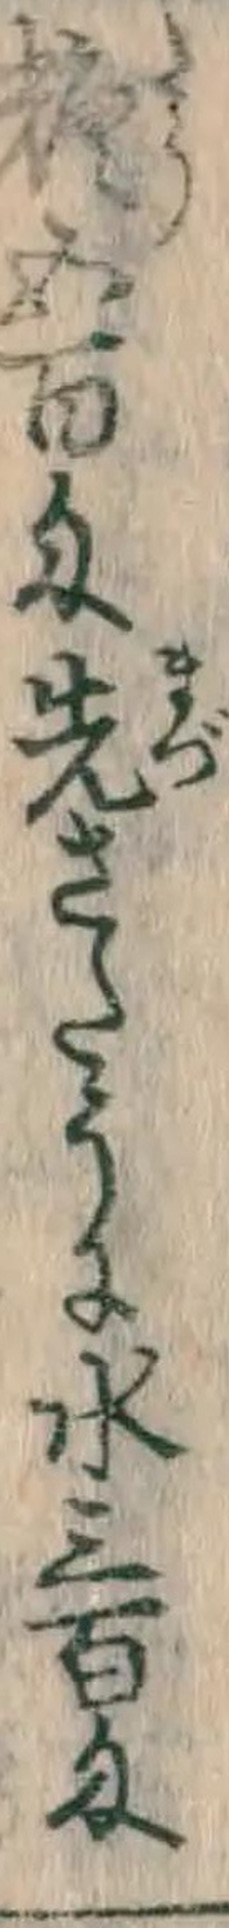糖五百匁先さたうに水三百匁
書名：広益秘事大全 3巻. [5]
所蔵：国立国会図書館 National Diet Library, JAPAN
